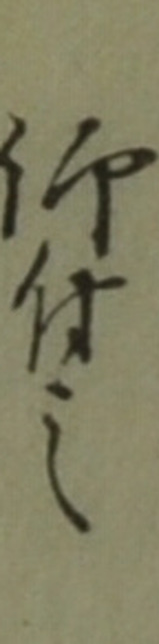仰付之
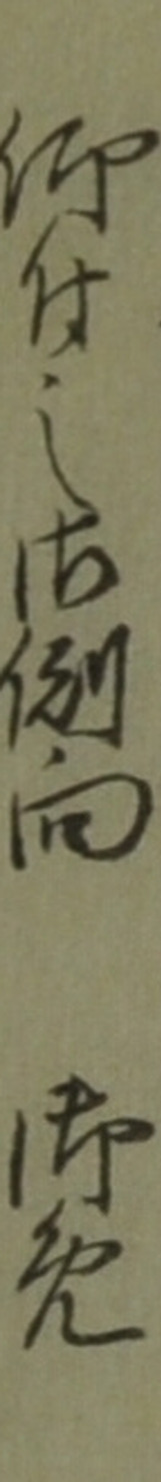仰付之御側向御免
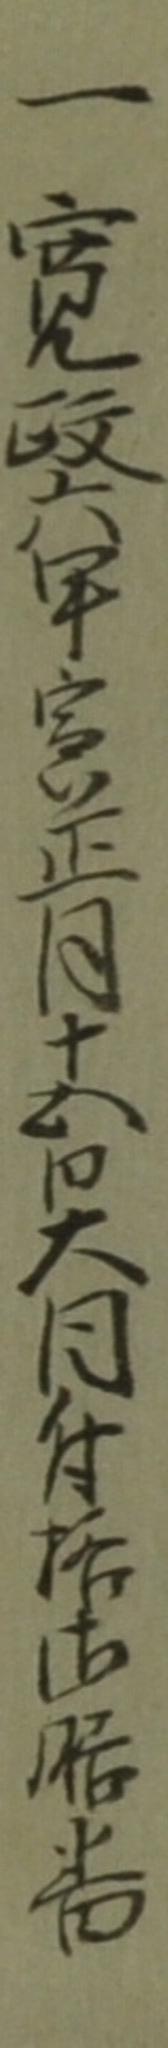一寛政六甲寅正月十五日大目付御膳番
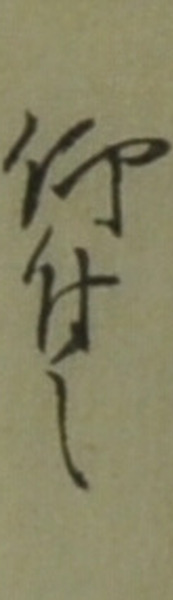仰付之
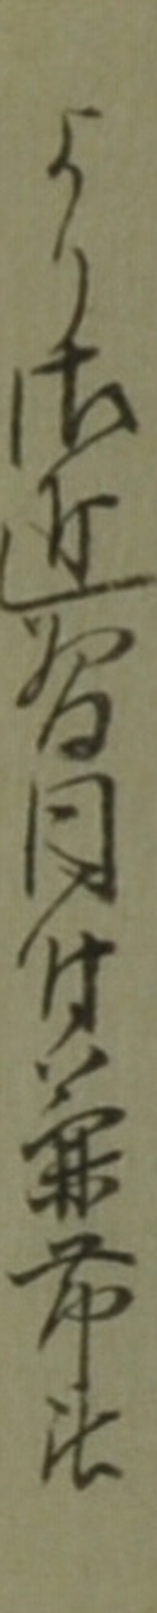より御近習目付兼帯被
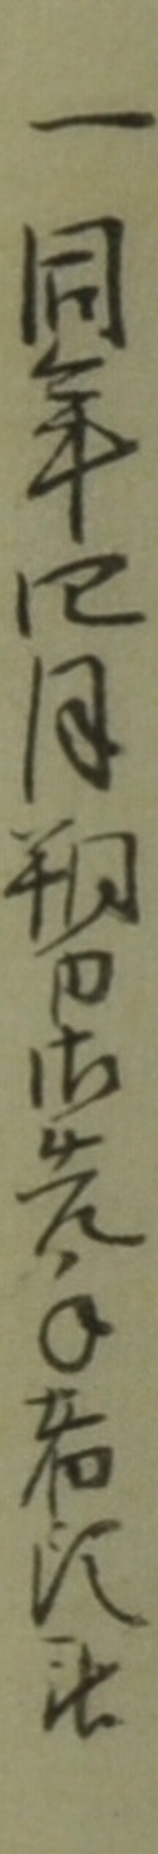一同年四月朔日御先手者頭被

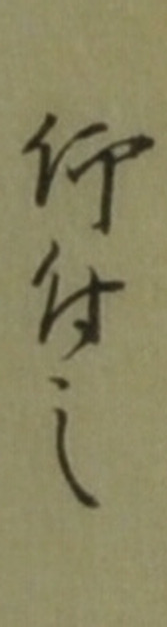仰付之
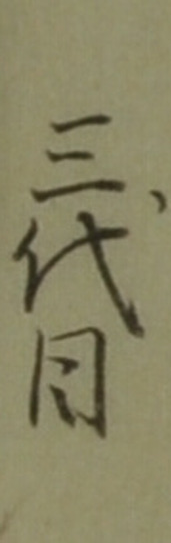三代目
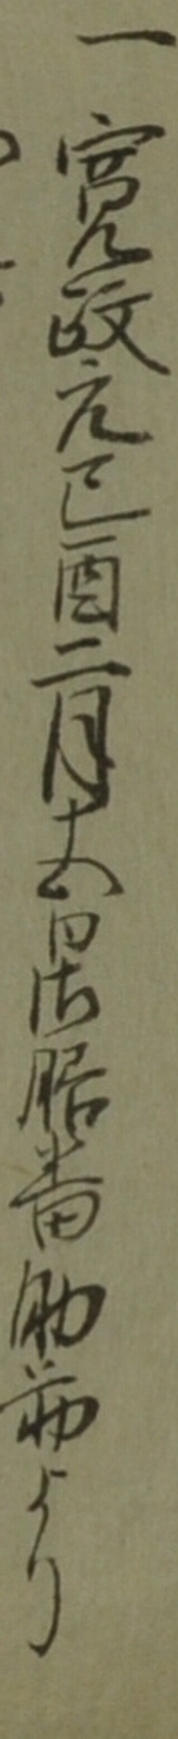一寛政元己酉二月十五日御膳番助勤より
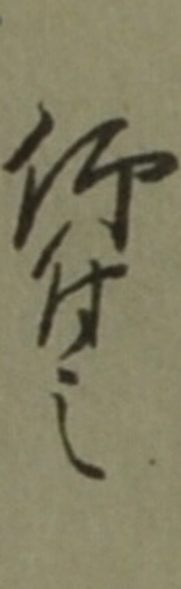仰付之
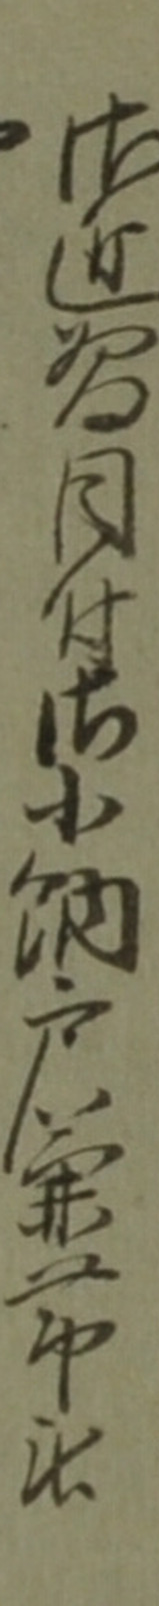御近習目付御小納戸兼帯被
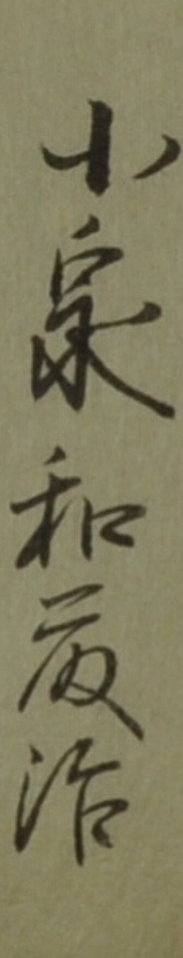小泉和藤治
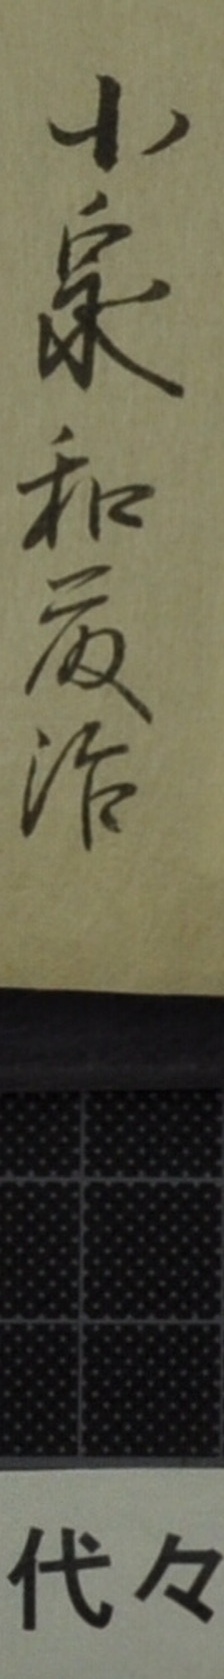小泉和藤治
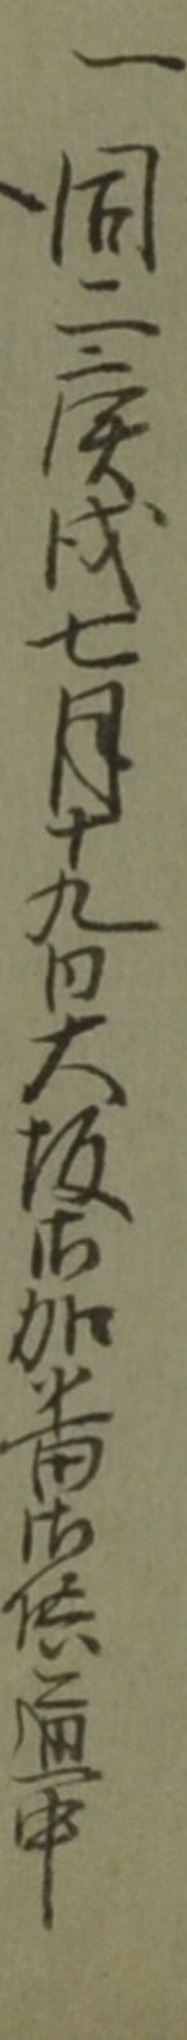一同二庚戌七月十九日大坂御加番御供道中
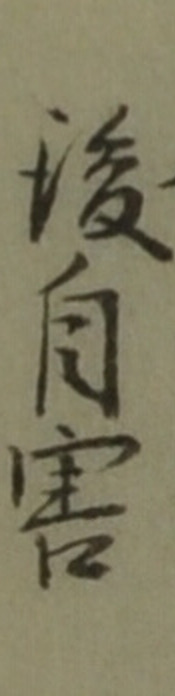後自害
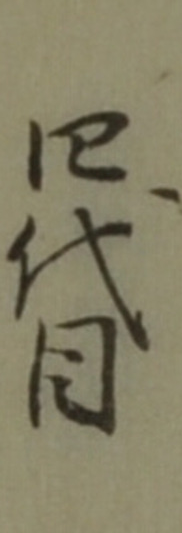四代目
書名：諸御役代々録（四）
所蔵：伊那市立高遠町図書館・合同会社AMANE
